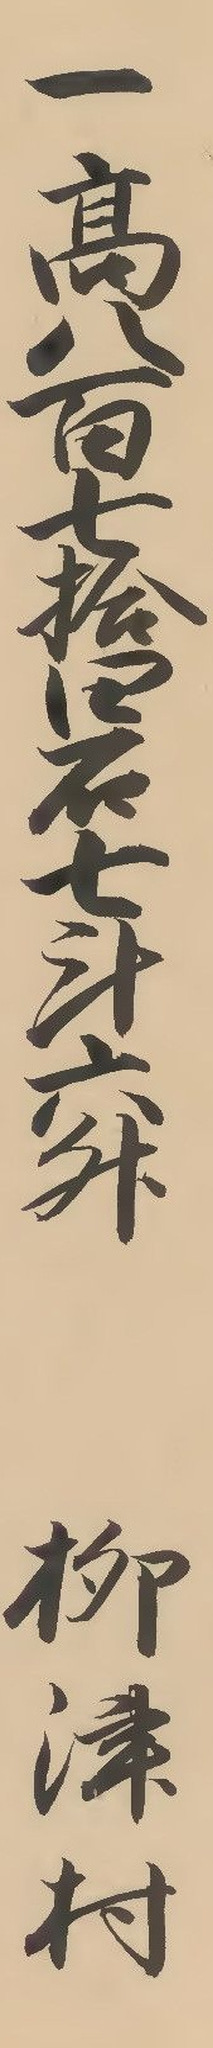一高八百七拾四石七斗六升柳津村
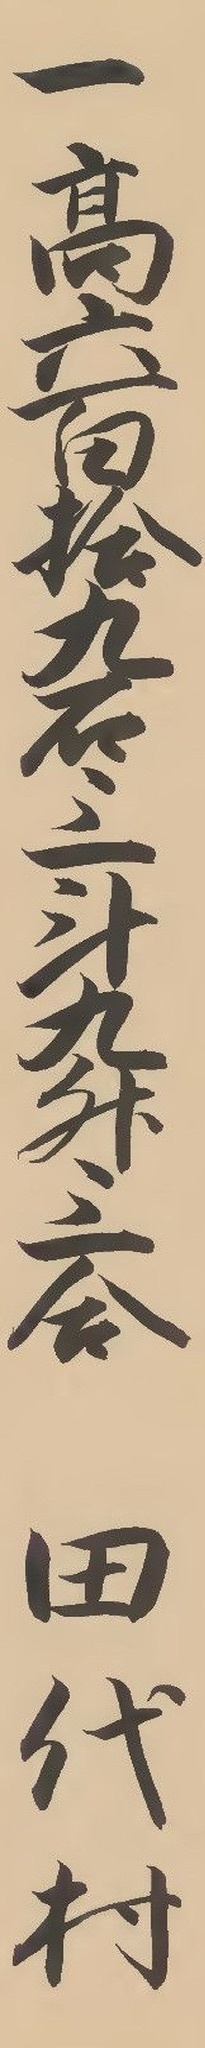一高六百拾九石三斗九升三合田代村
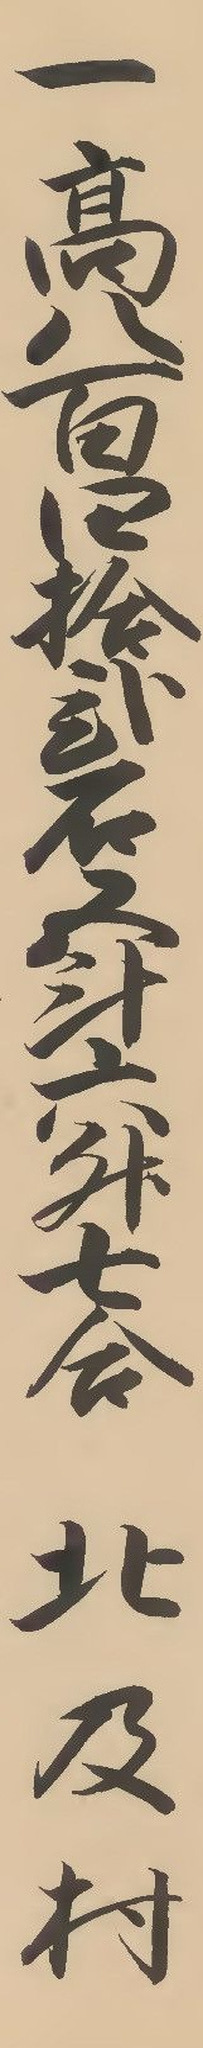一高八百四拾弐石五斗六升七合北及村
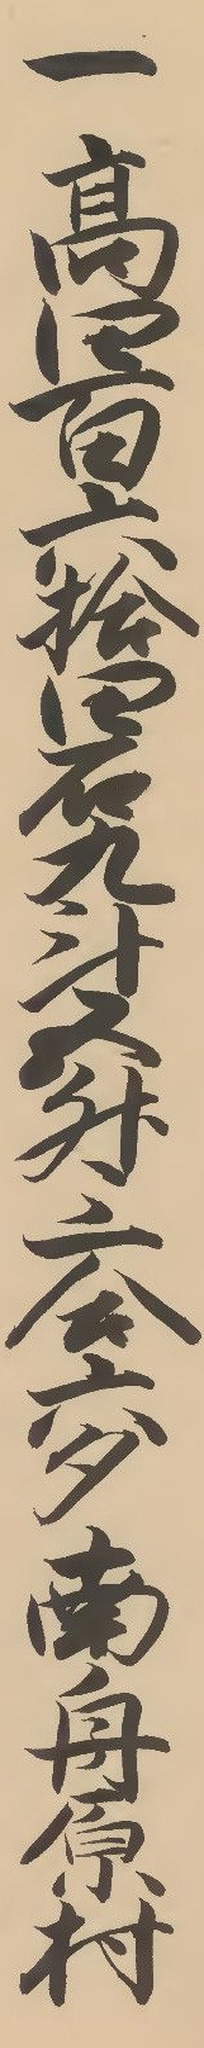一高四百六拾四石九斗五升三合六勺南舟原村
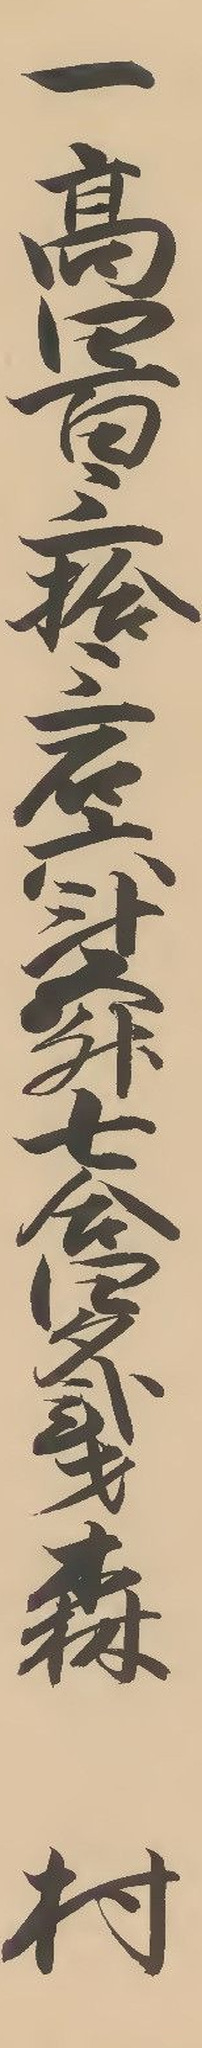一高四百三拾三石六斗五升七合四勺弐才森村

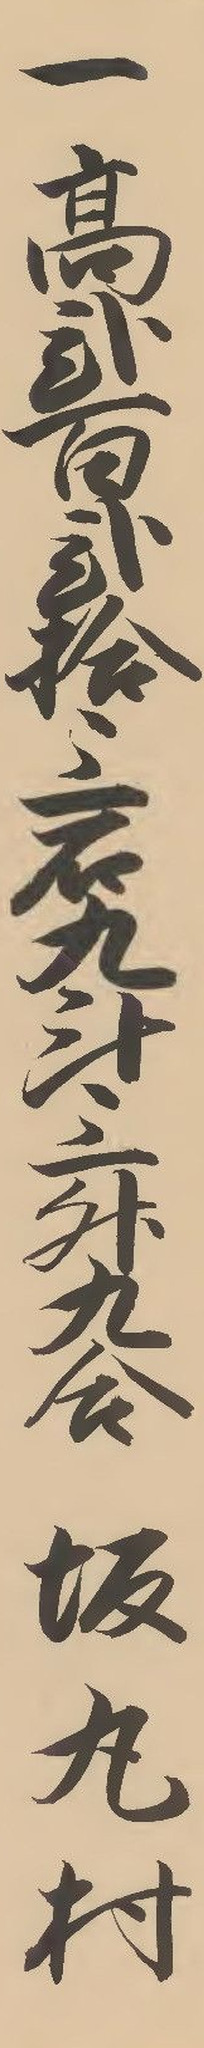一高弐百弐拾三石九斗三升九合坂丸村
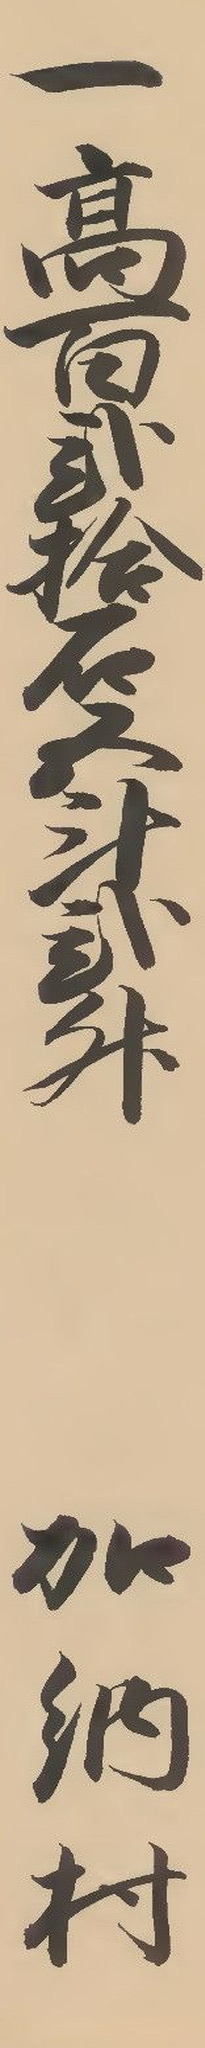一高百弐拾石五斗弐升加納村
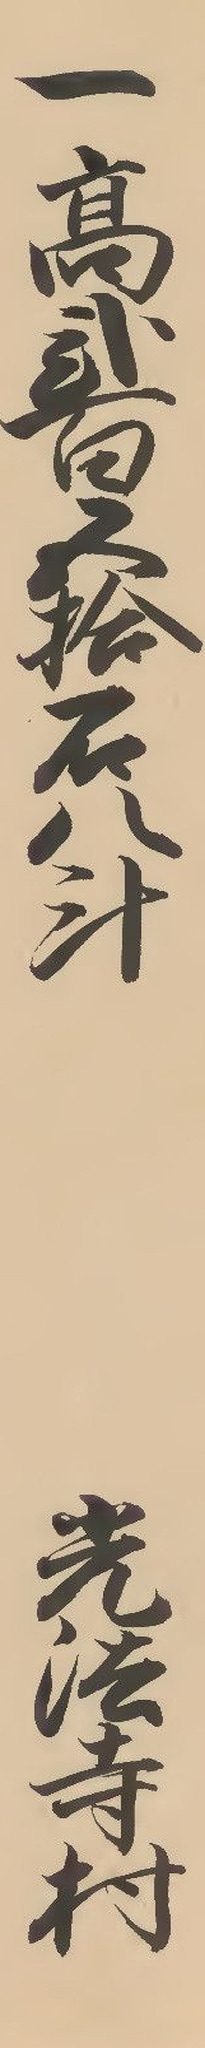一高弐百五拾石八斗光法寺村
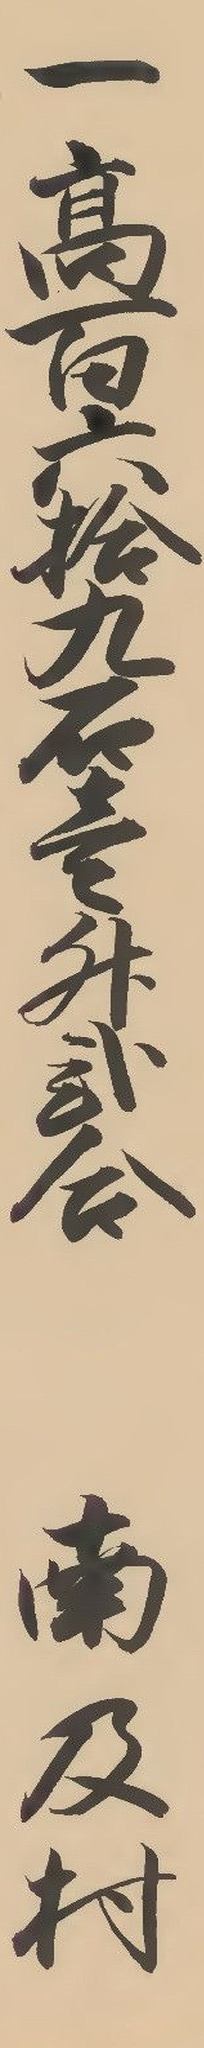一高百六拾九石壱升弐合南及村
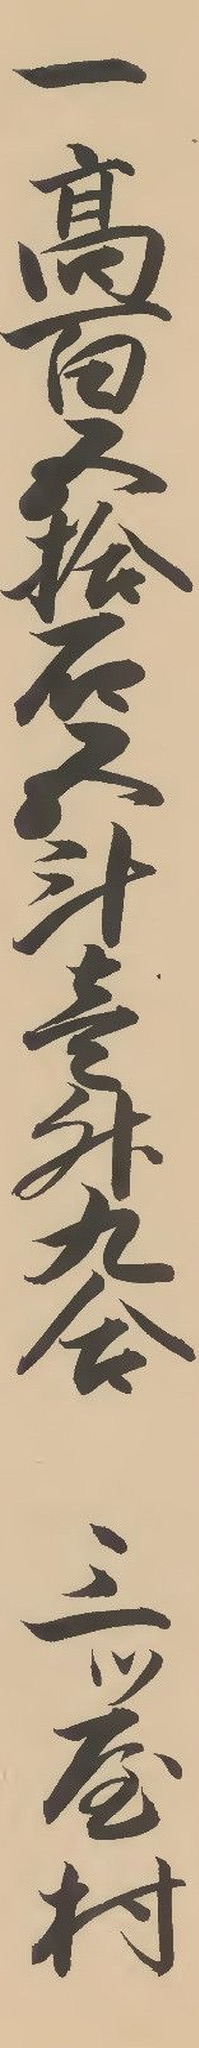一高百五拾石五斗壱升九合三ツ屋村
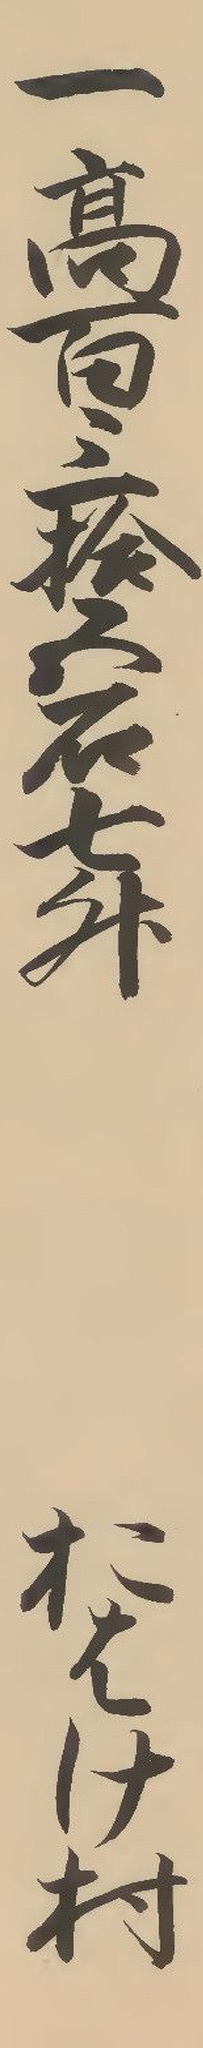一高百三拾五石七升おはけ村
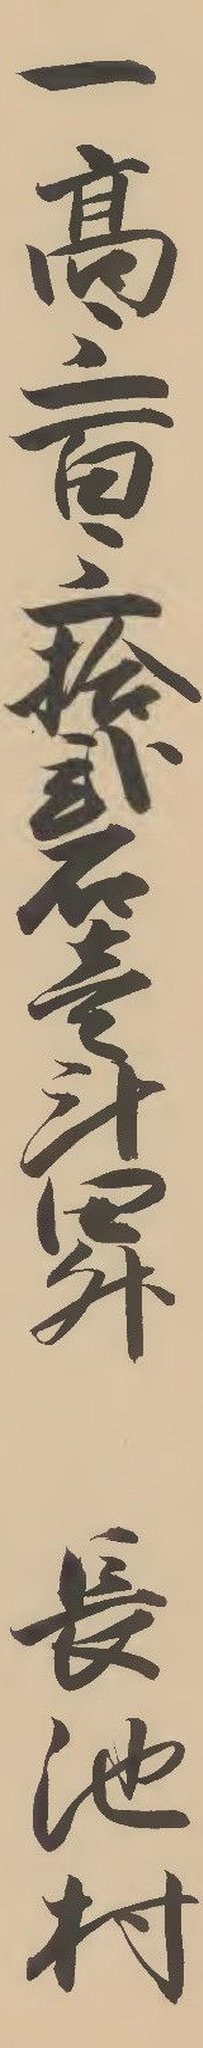一高三百三拾弐石壱斗四升長池村
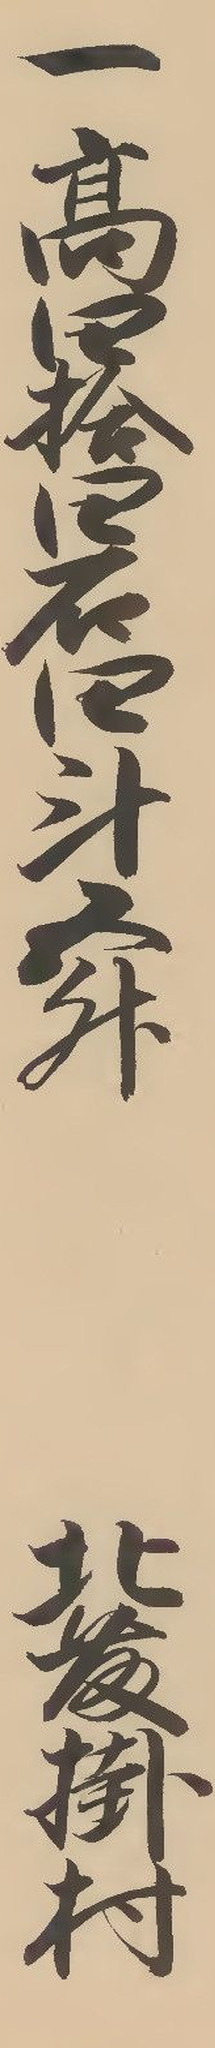一高四拾四石四斗五升北藤掛村

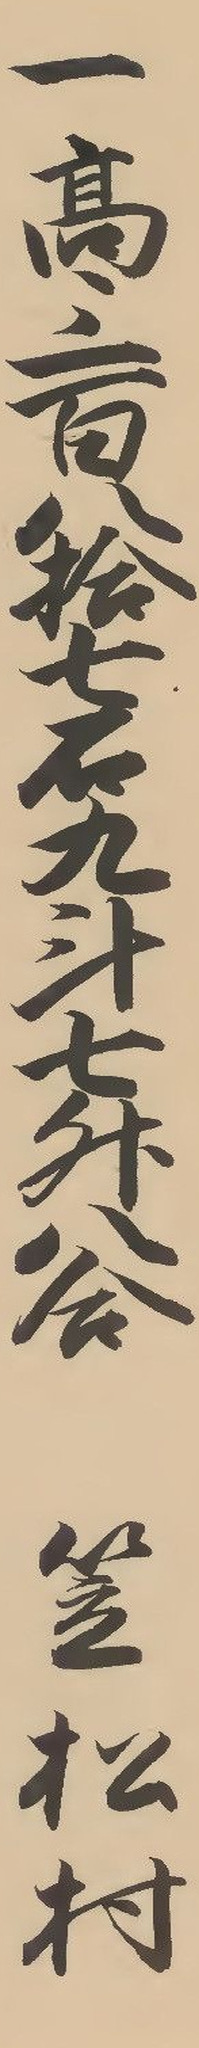一高三百八拾七石九斗七升八合笠松村
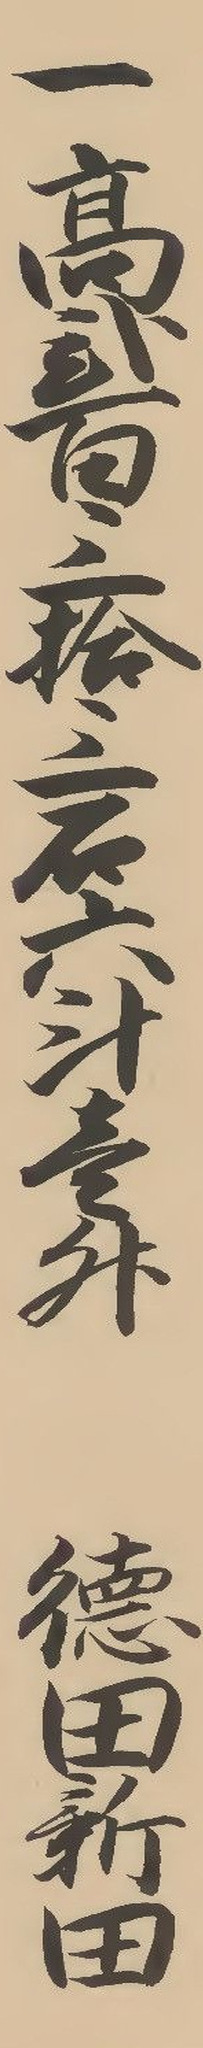一高弐百三拾三石六斗壱升徳田新田
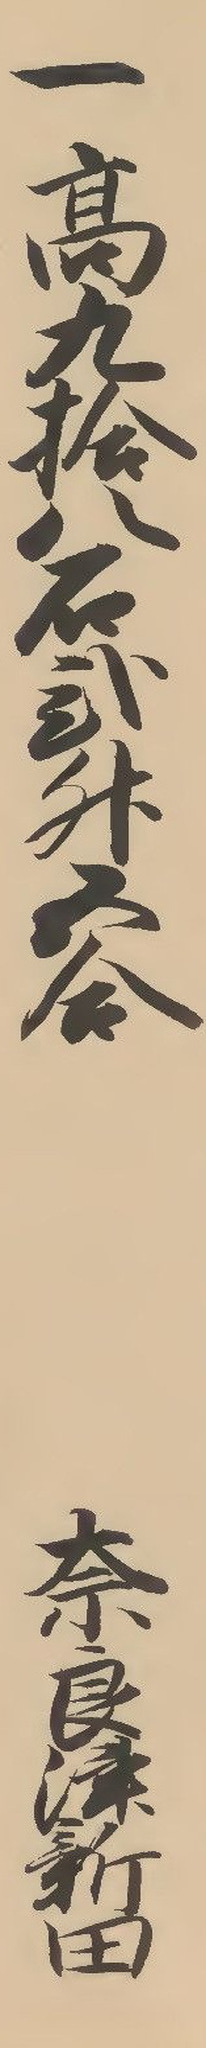一高九拾八石弐升五合奈良津新田
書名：美濃国郷帳
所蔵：国立公文書館 National Archives of Japan
